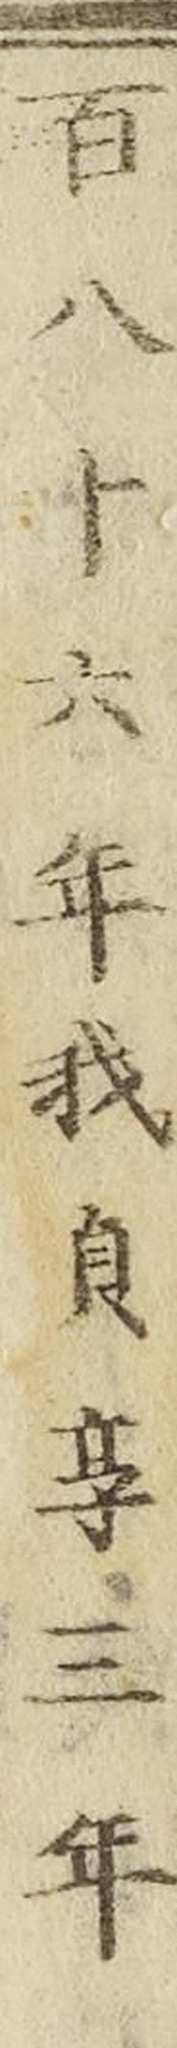百八十六年我貞享三年
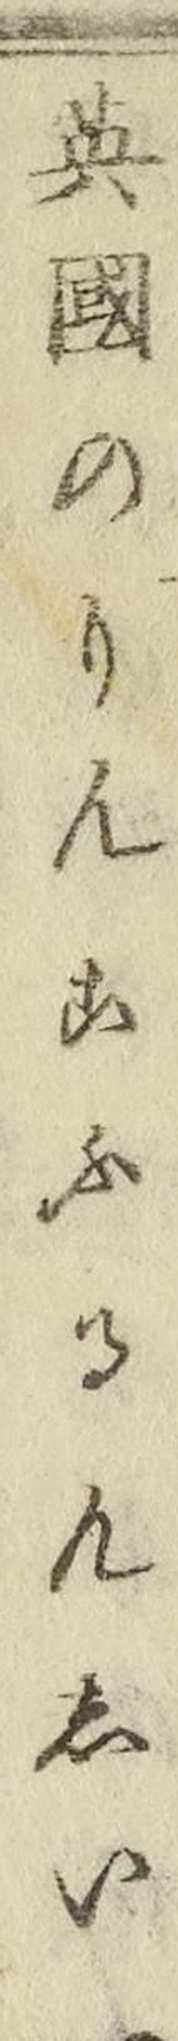英国の「りんこふるんしい
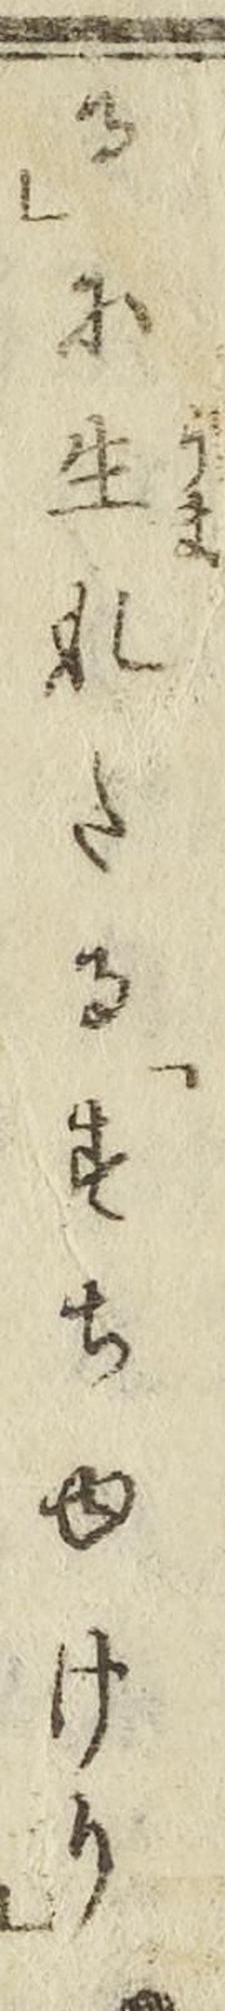る」に生れたる「すちゆけり」
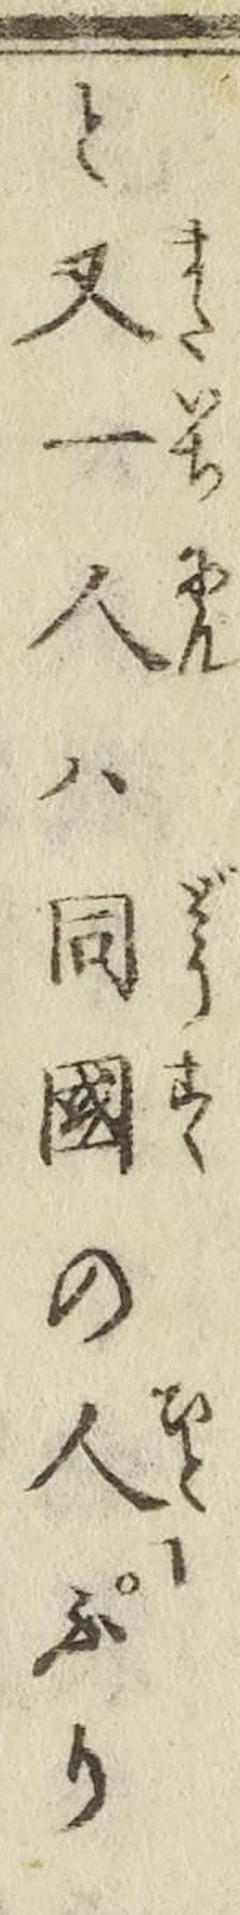と又一人は同国の人「ぷり
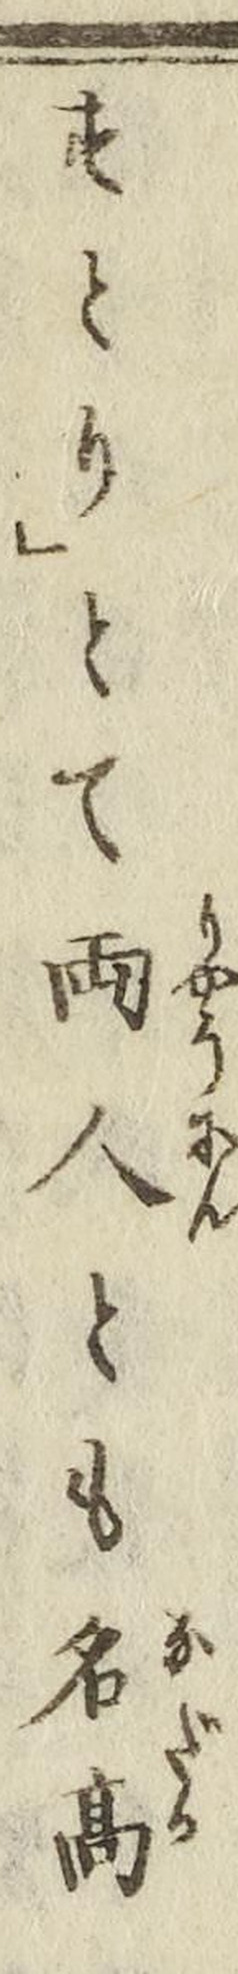すとり」とて両人とも名高
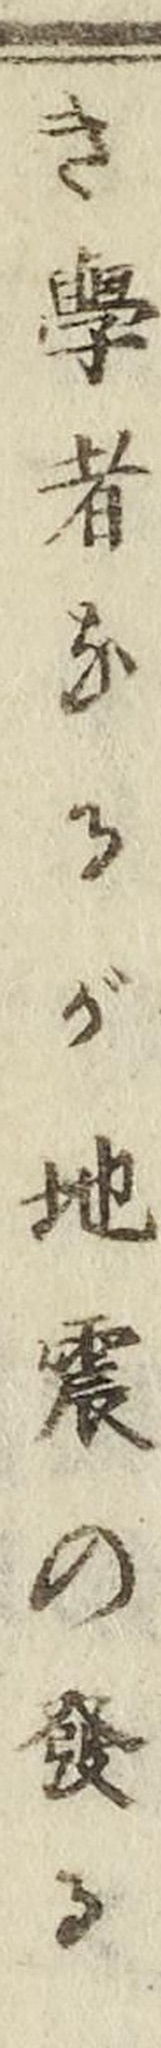き学者なるが地震の発る
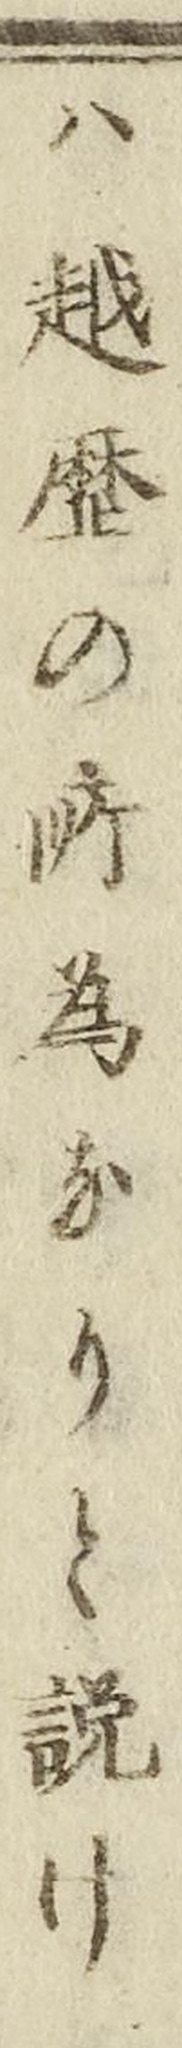は越歴の所為なりと説け
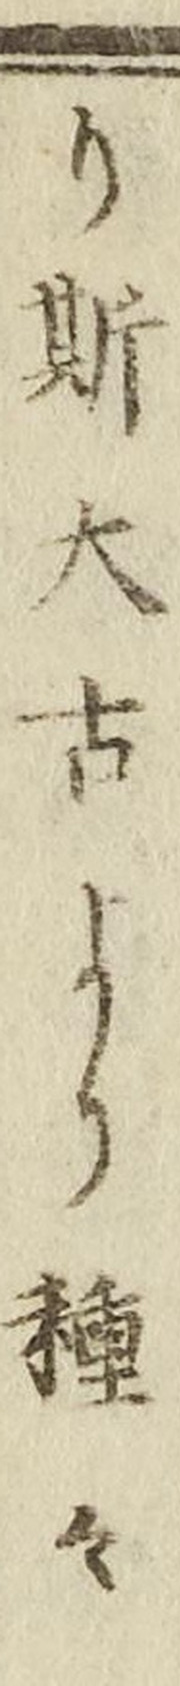り斯大古より種々
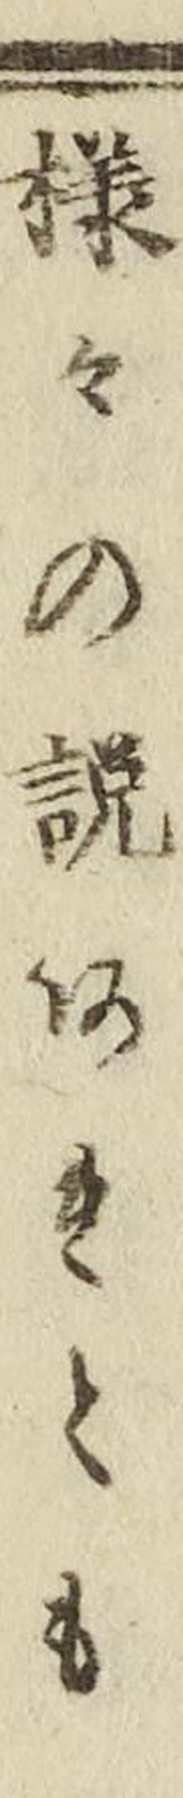様々の説あれとも
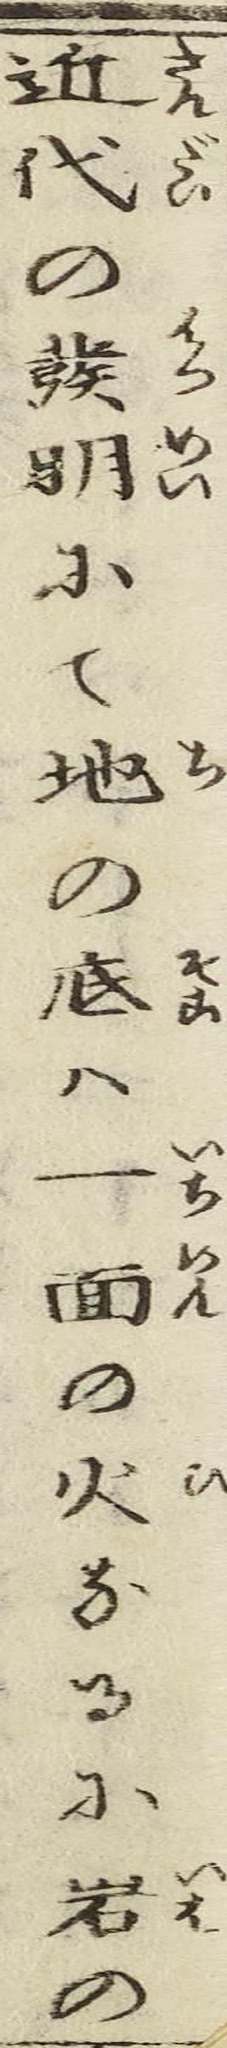近代の発明にて地の底は一面の火なるに岩の
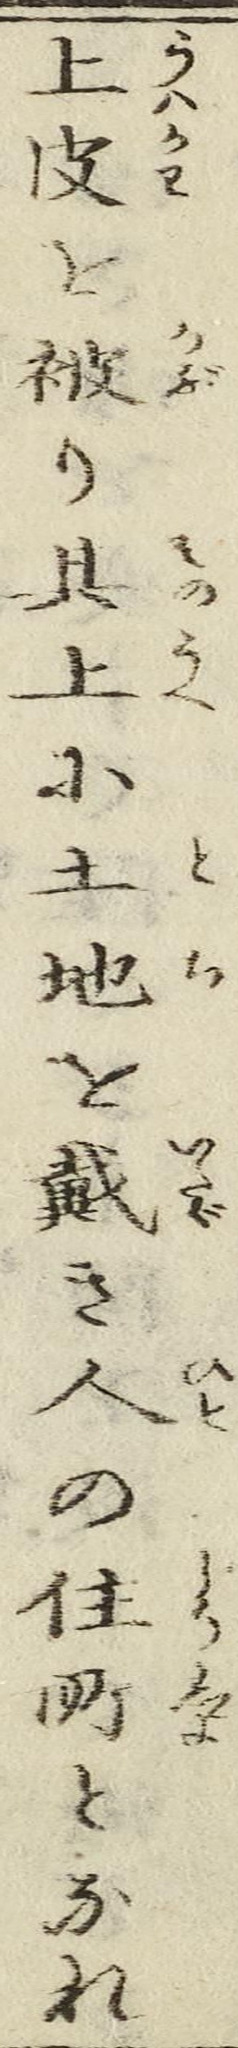上皮を被り其上に土地を戴き人の住所となれ
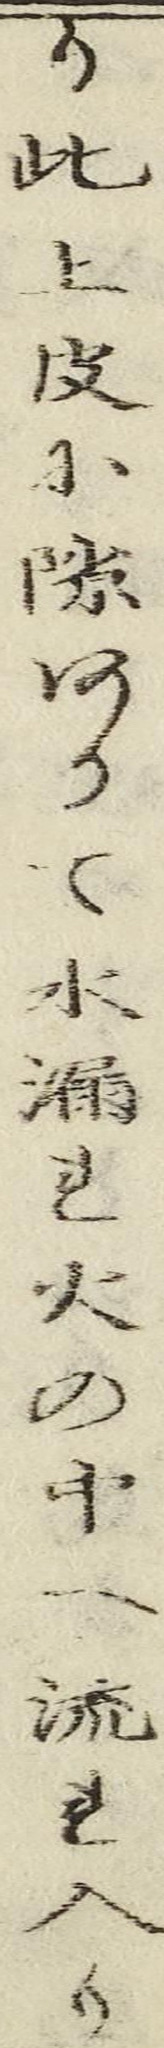り此上皮に隙ありて水漏れ火の中へ流れ入り
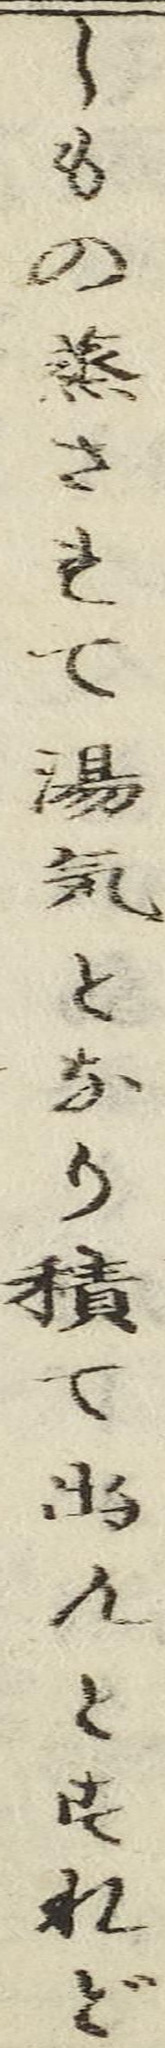しもの蒸されて湯気となり積て出んとすれど
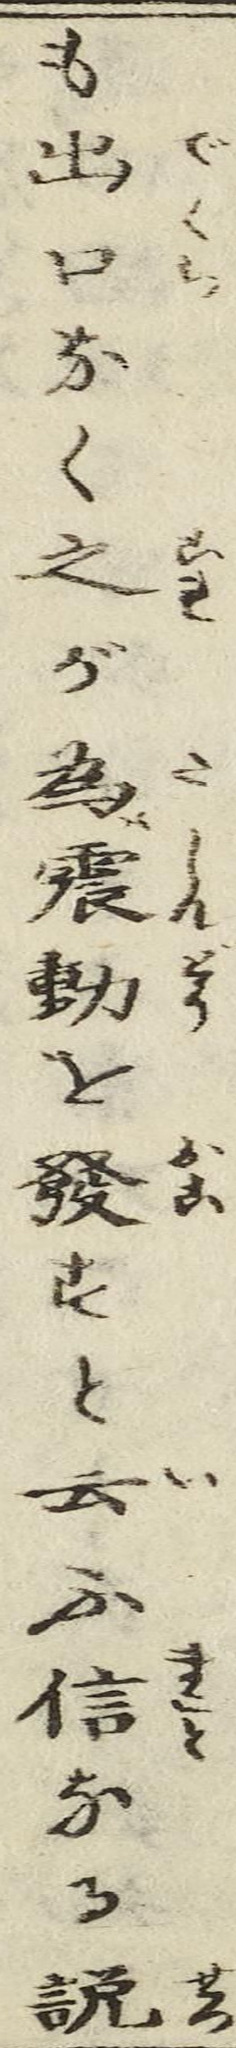も出口なく之が為メ震動を発すと云ふ信なる説
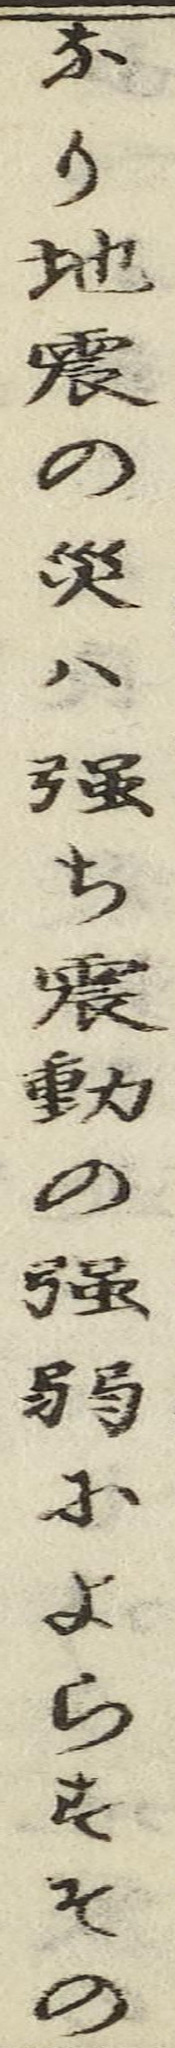なり地震の災は強ち震動の強弱によらすその
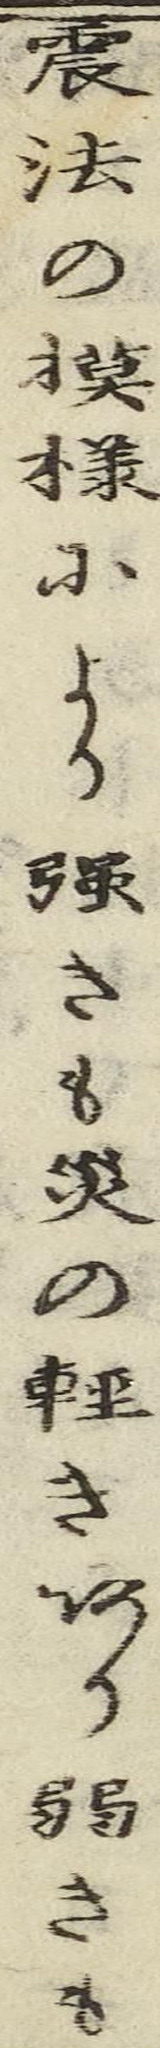震法の模様により強きも災の軽きあり弱きも
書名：天変地異
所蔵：東京大学地震研究所図書室 Earthquake Research Institute Library, The University of Tokyo, JAPAN
